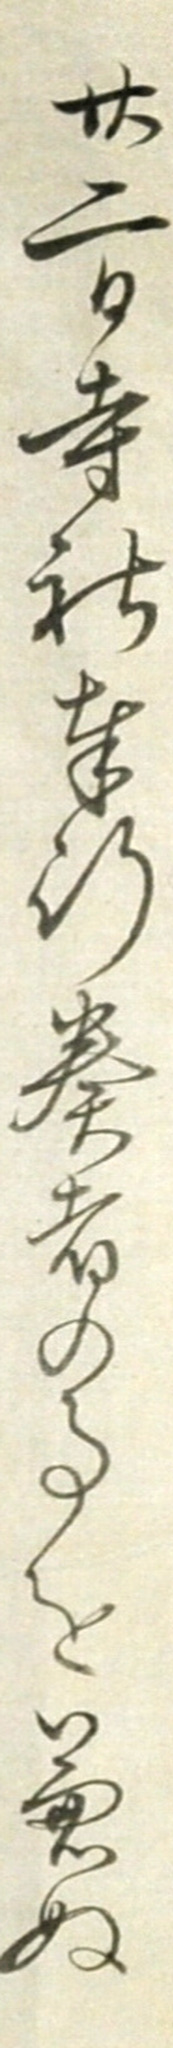廿二日寺社奉行奏者の事を兼ぬ
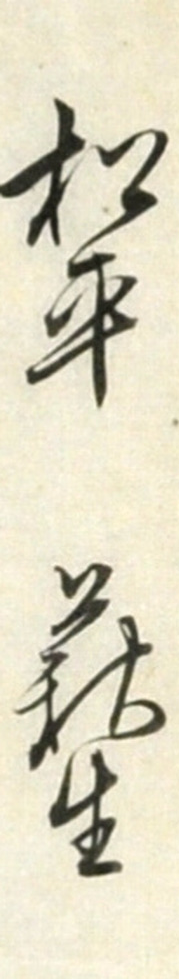松平萩生
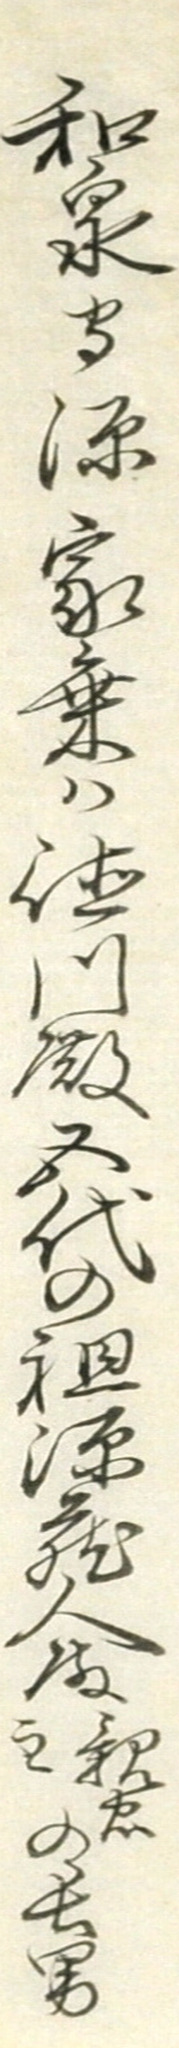和泉守源家乗は徳川殿五代の祖源蔵人殿親忠主の長男
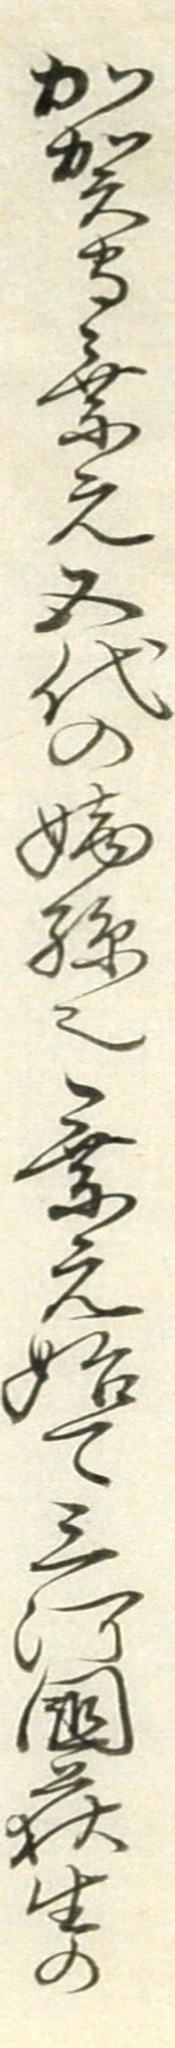加賀守乗元五代の嫡孫也乘元始て三河国荻生の
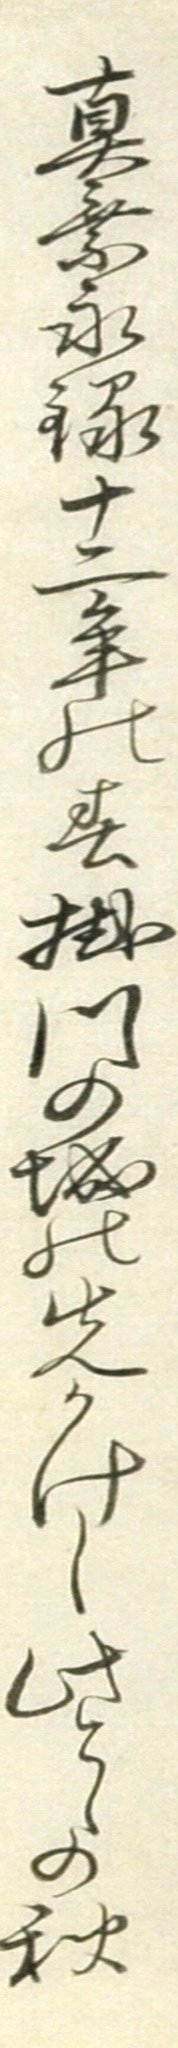真乗永禄十二年の春掛川の城の先かけし此としの秋
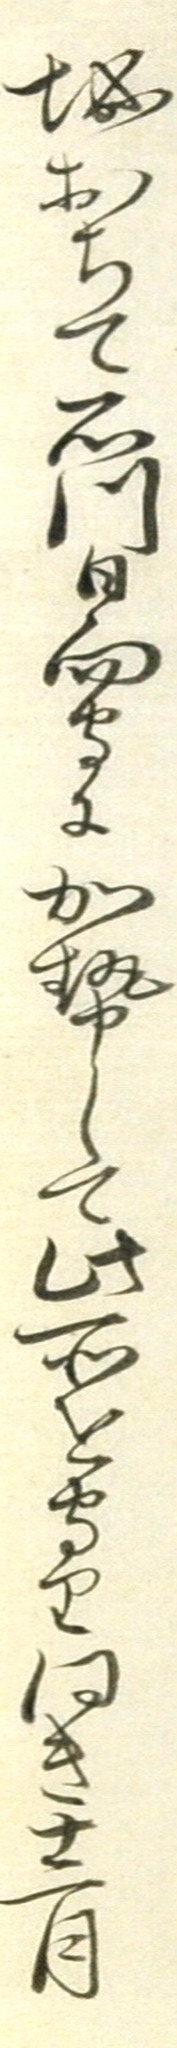城おちて石川日向守に加勢して此所を守り同き十二月

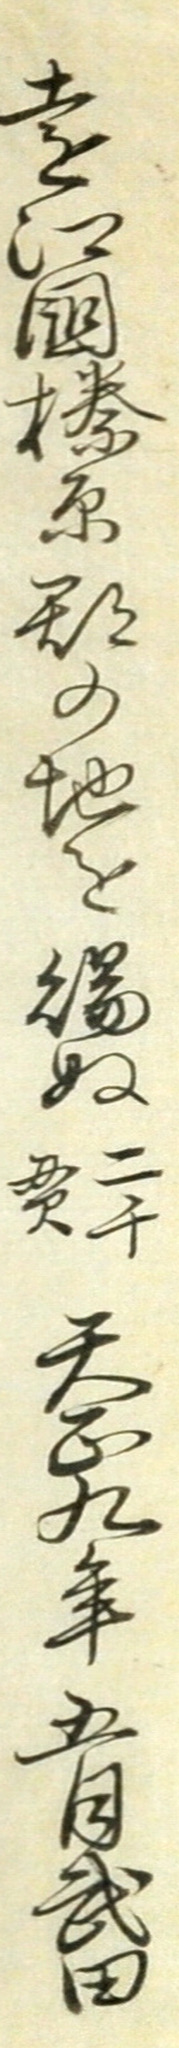遠江国榛原郡の地を賜ぬ二千貫天正九年五月武田
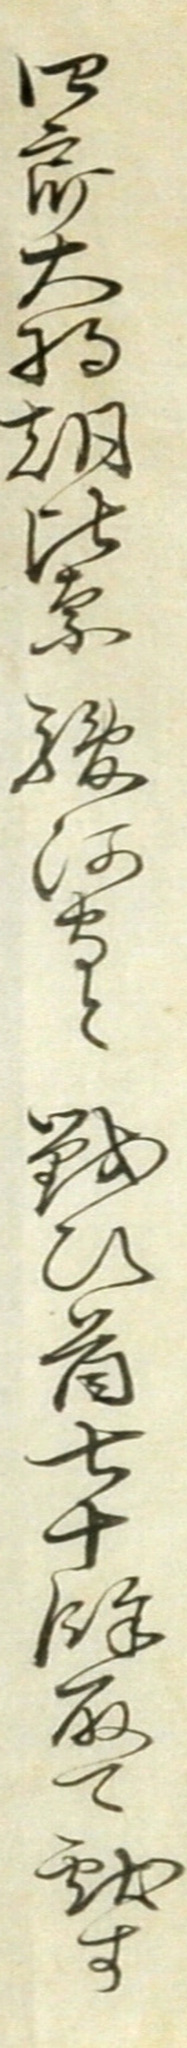四郎大将朝比奈駿河守と戦ひ首七十余取て献す
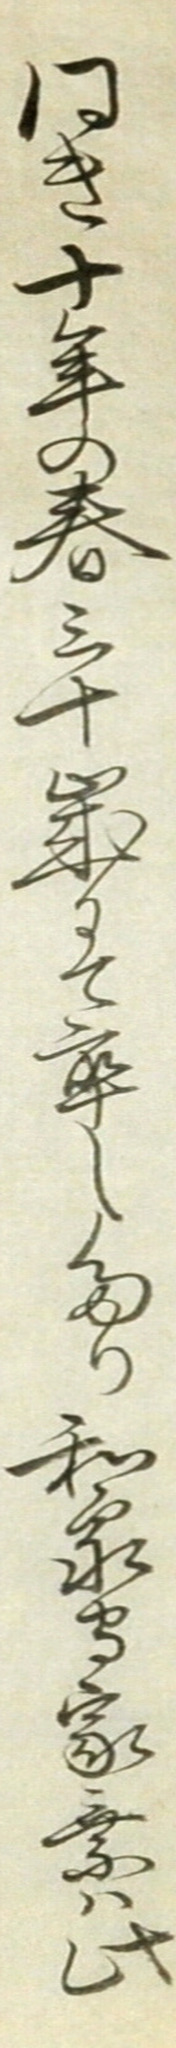同き十年の春三十歳にて卒したり和泉守家乗は此
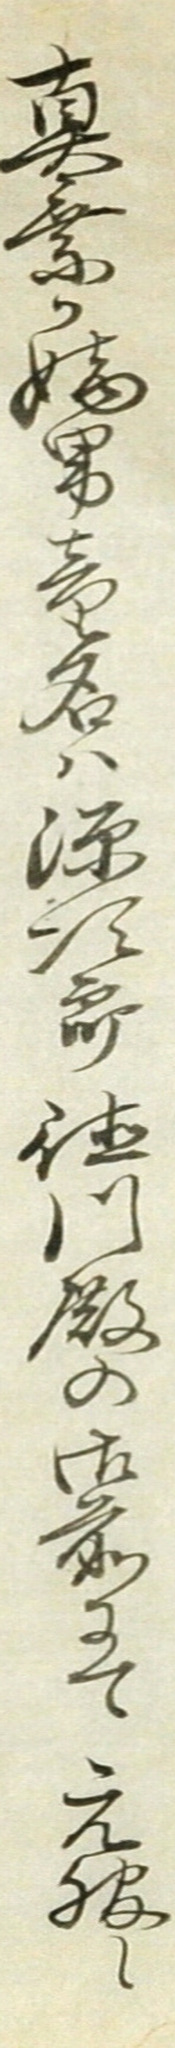真乗か嫡男童名は源次郎徳川殿の御前にて元服し
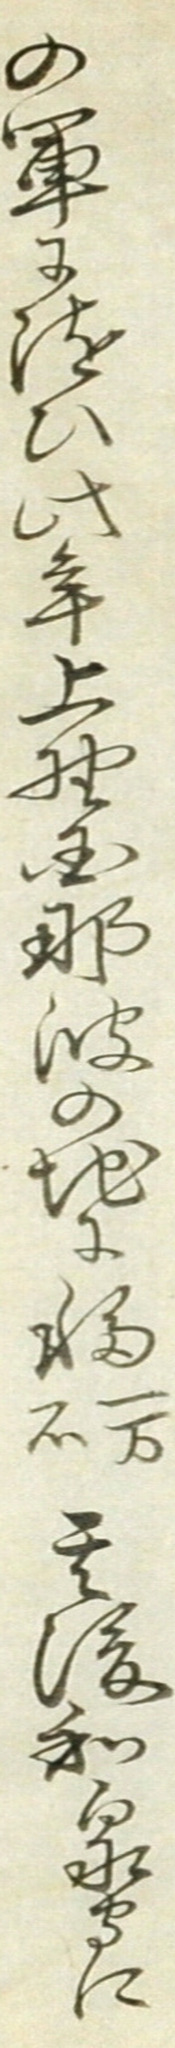の軍に随ひ此年上野国那波の地に移一万石其後和泉守に
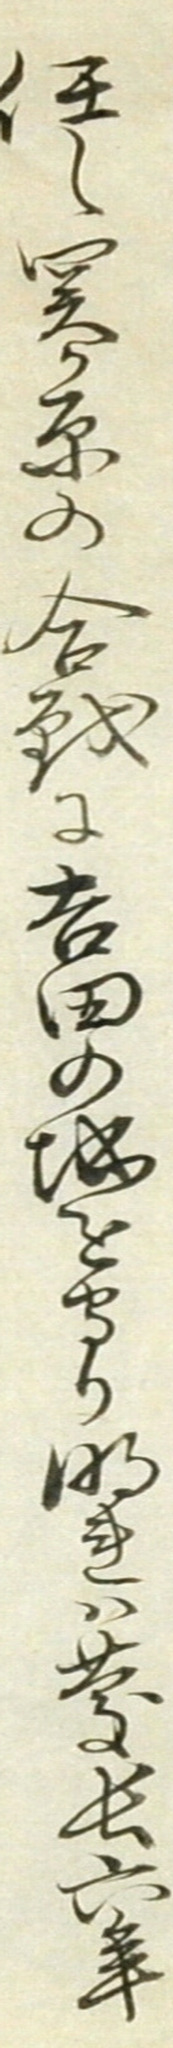任し関ヶ原の合戦に吉田の城を守り明れは慶長六年
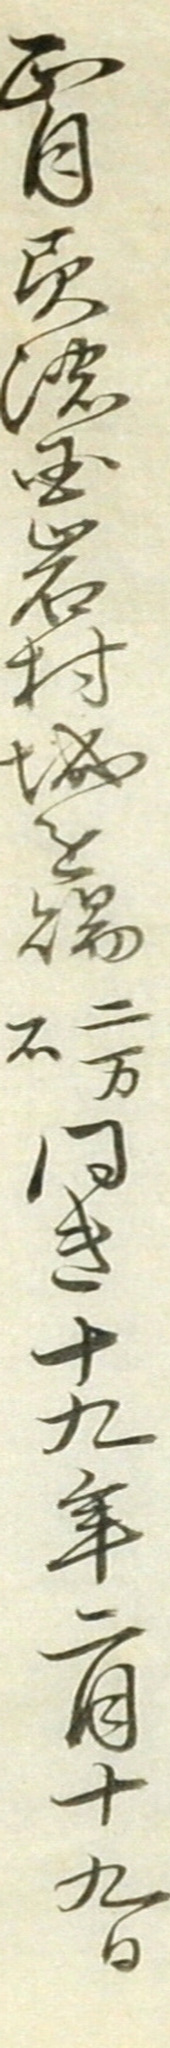正月美濃邦岩村城を賜二万石同き十九年二月十九日
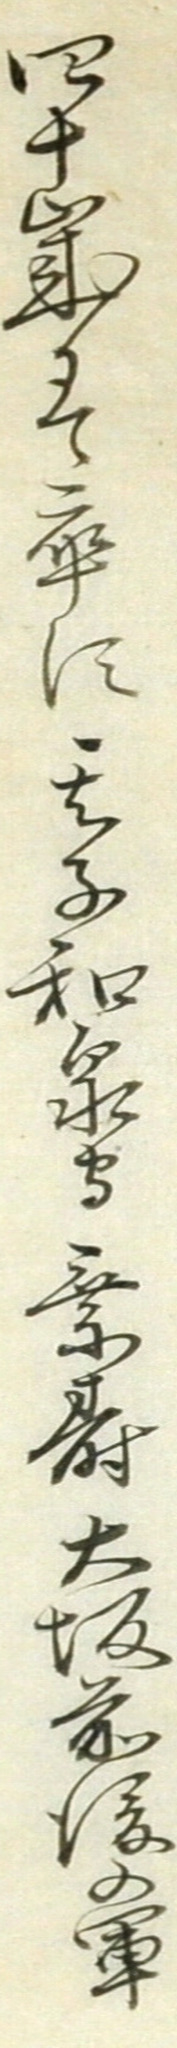四十歳にて卒す其子和泉守乗寿大坂前後の軍
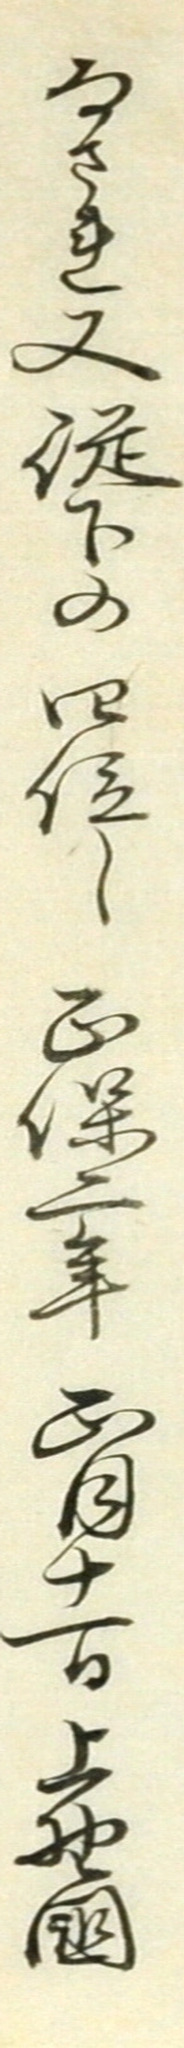なされ又従下の四位し正保二年正月十一日上野国
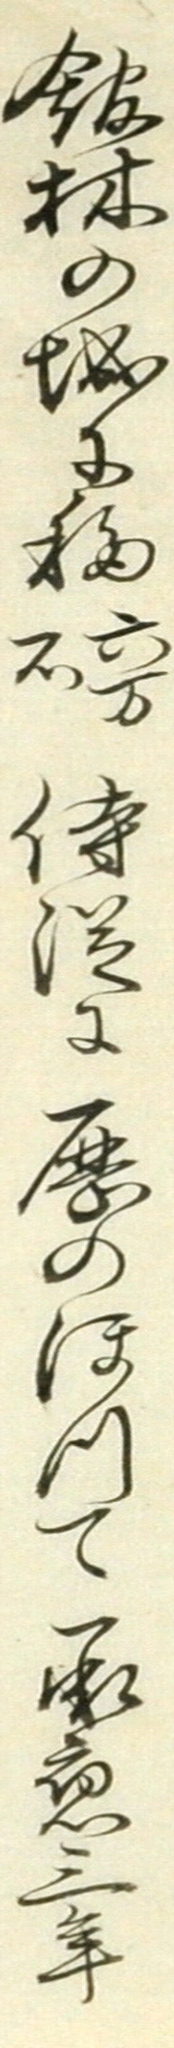館林の城に移六万石侍従に歴のほつて承応三年
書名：藩翰譜（二・三）
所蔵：伊那市立高遠町図書館・合同会社AMANE
